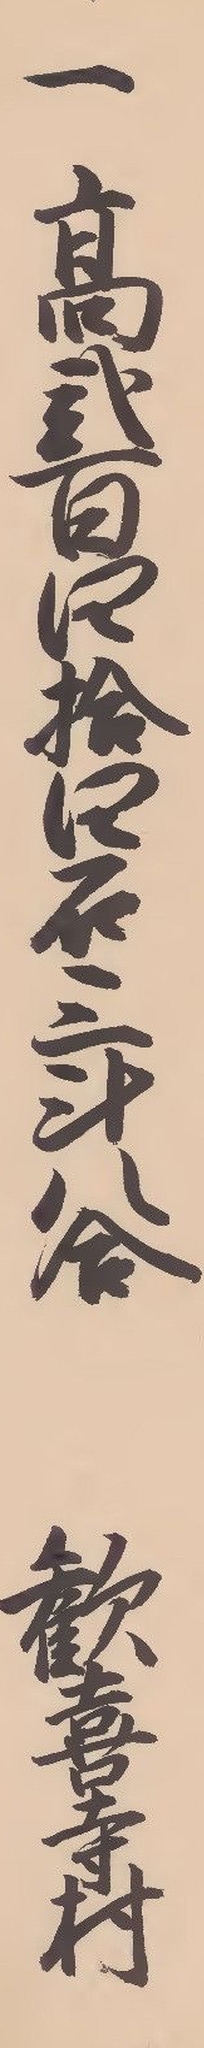一高弐百四拾四石三斗八合歓喜寺村
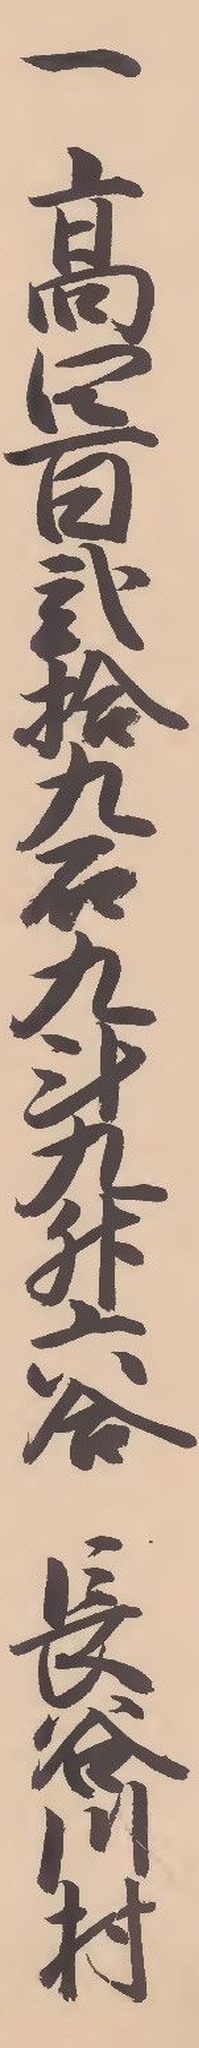一高四百弐拾九石九斗九升六合長谷川村
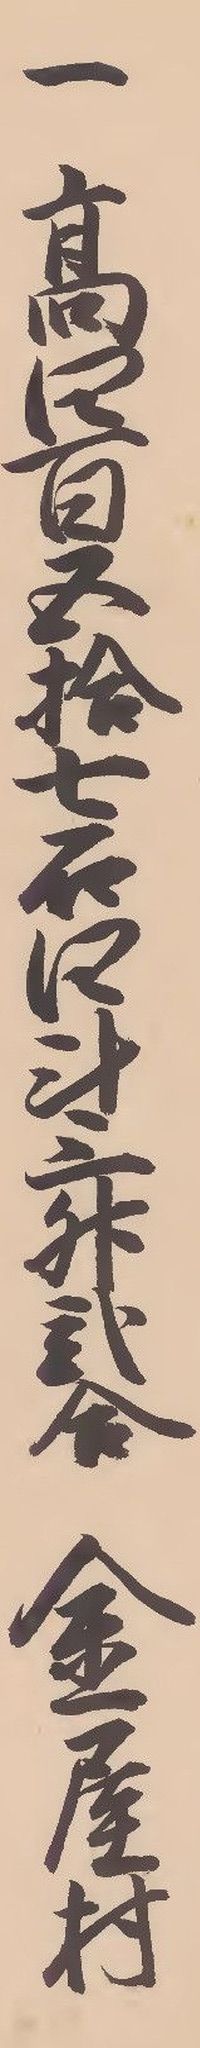一高四百五拾七石四斗三升弐合金屋村

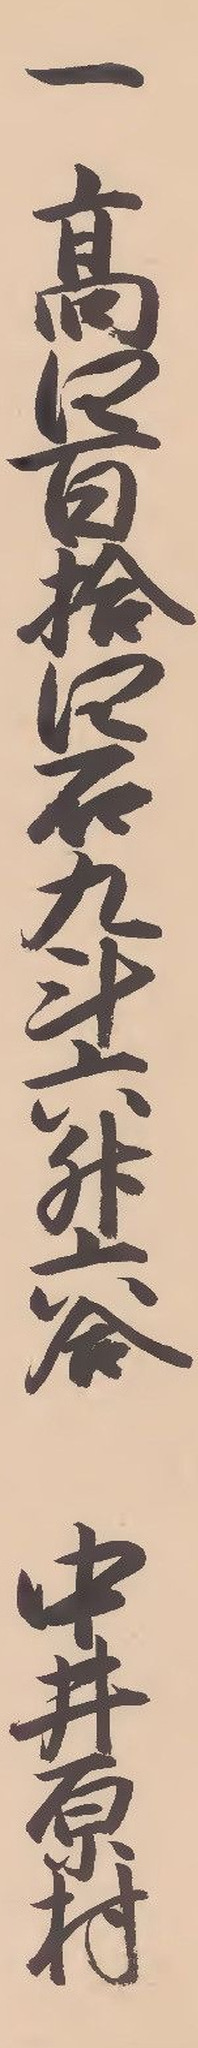一高四百拾四石九斗六升六合中井原村
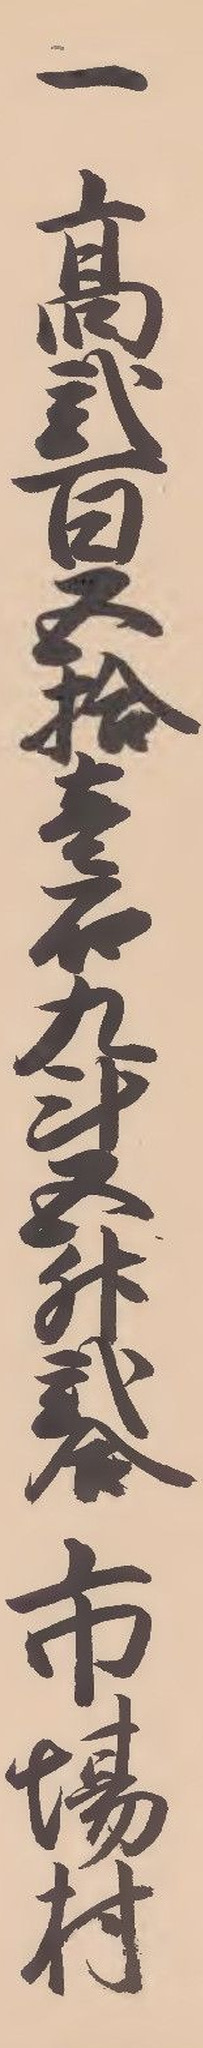一高弐百五拾壱石九斗五升弐合市場村
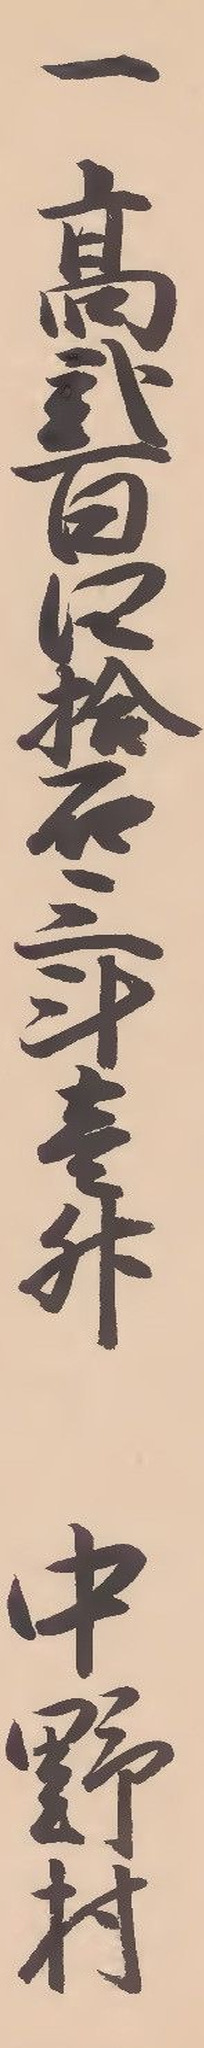一高弐百四拾石三斗壱升中野村
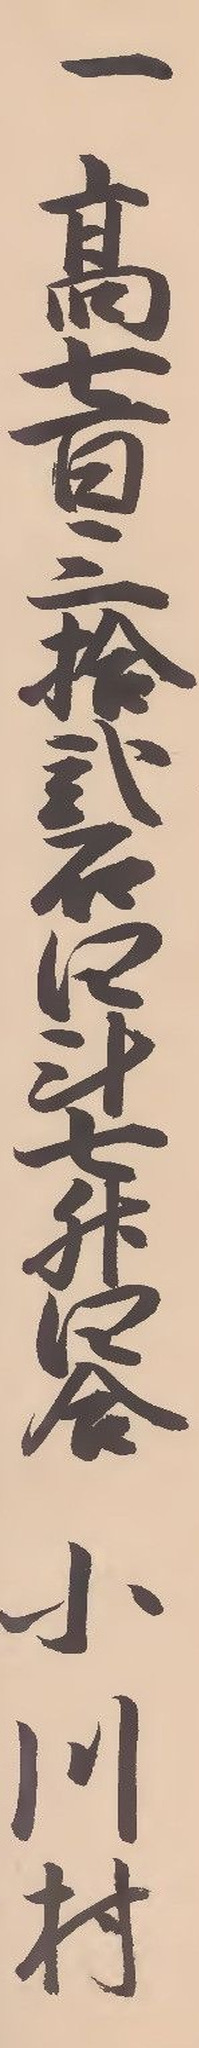一高七百三拾弐石四斗七升四合小川村
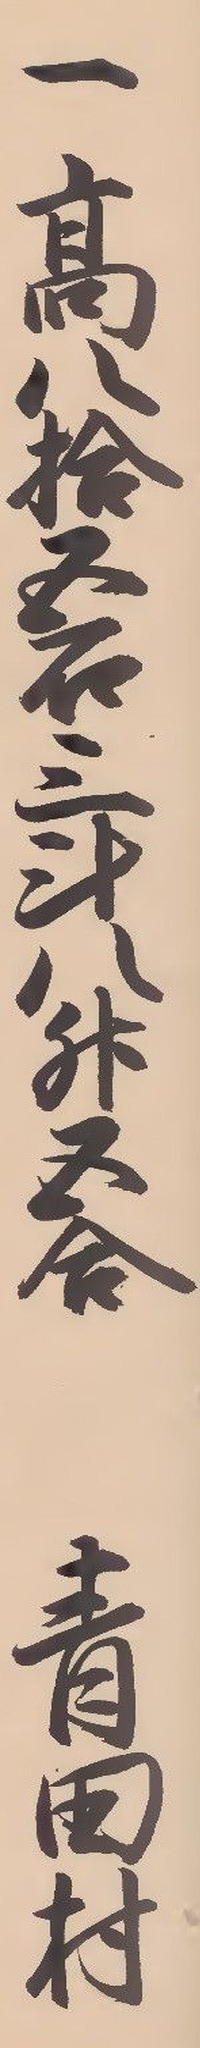一高八拾五石三斗八升五合青田村
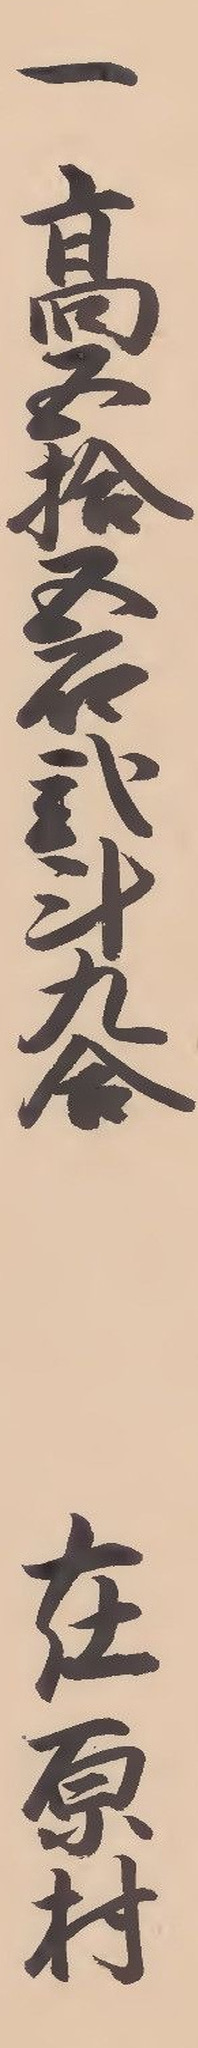一高五拾五石弐斗九合在原村
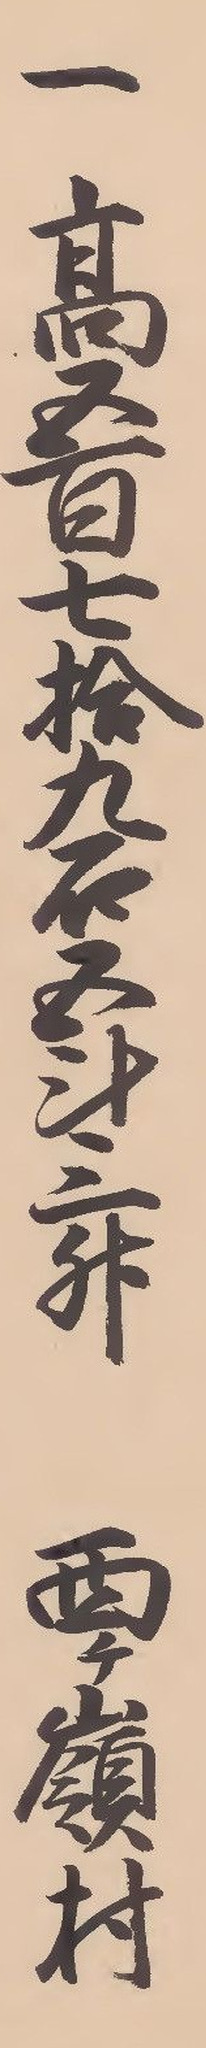一高五百七拾九石五斗三升西ヶ嶺村
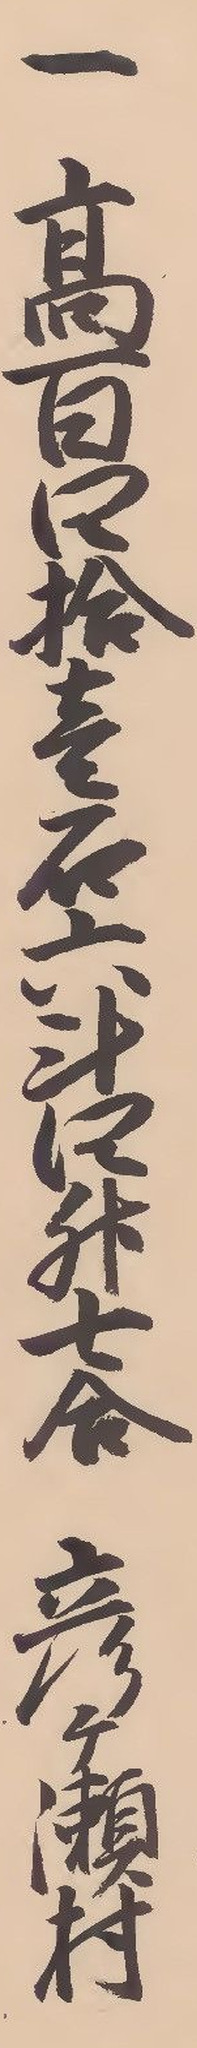一高百四拾壱石六斗四升七合彦ヶ瀬村

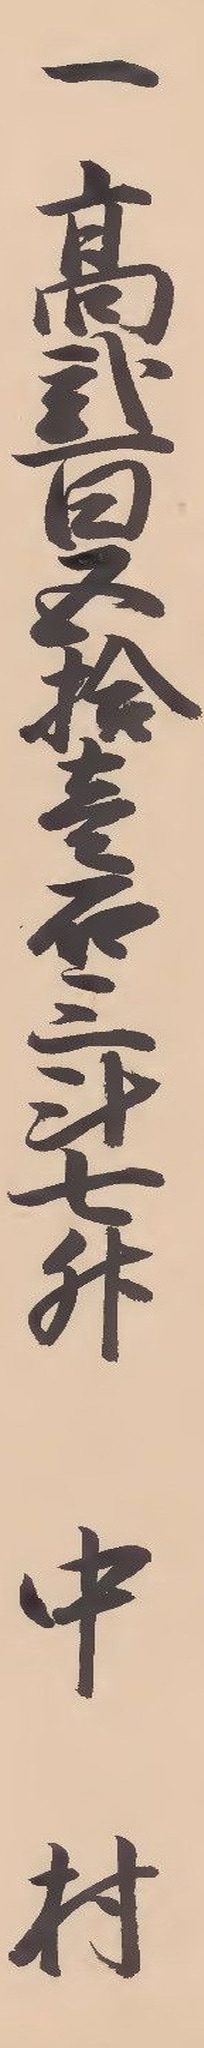一高弐百五拾壱石三斗七升中村
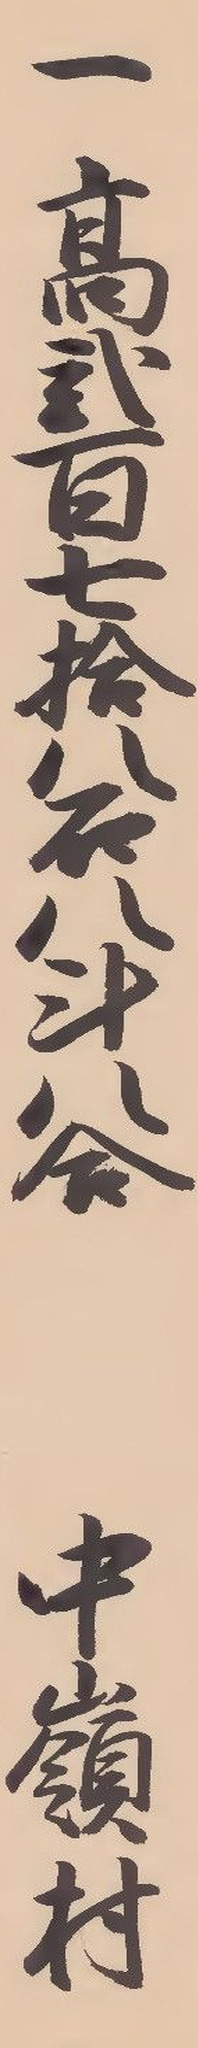一高弐百七拾八石八斗八合中嶺村
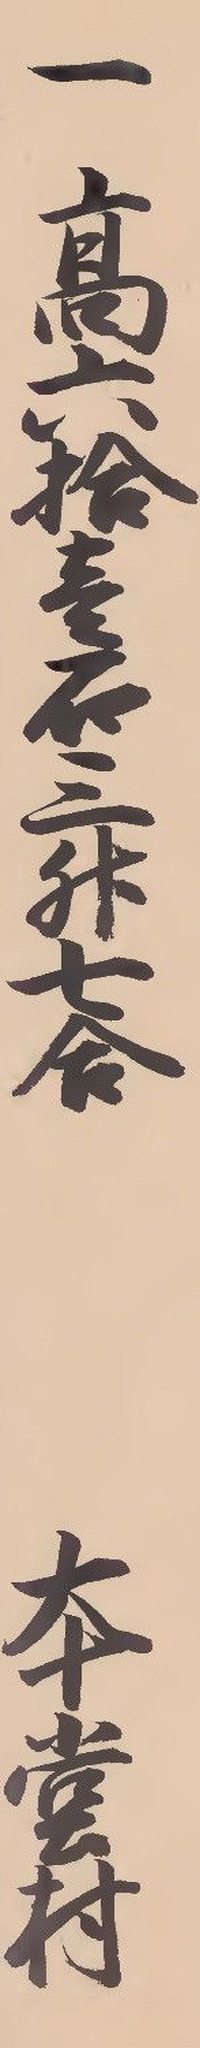一高六拾壱石三升七合本堂村
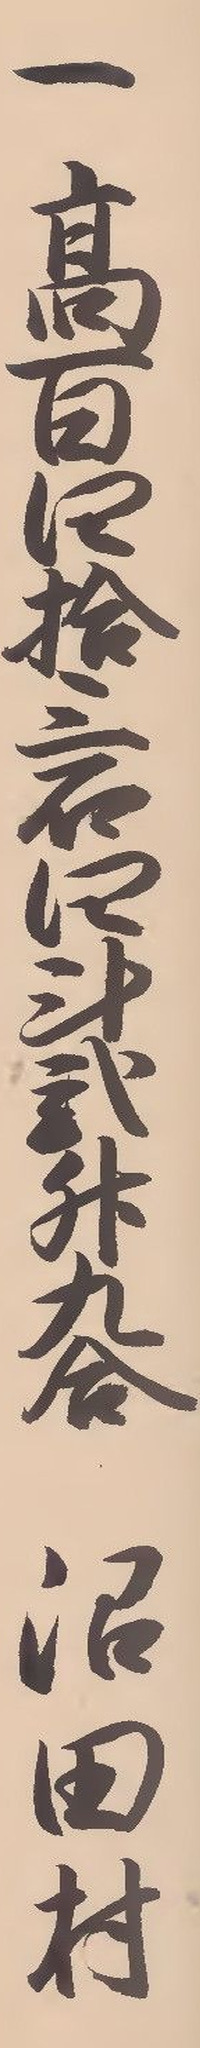一高百四拾三石四斗弐升九合沼田村
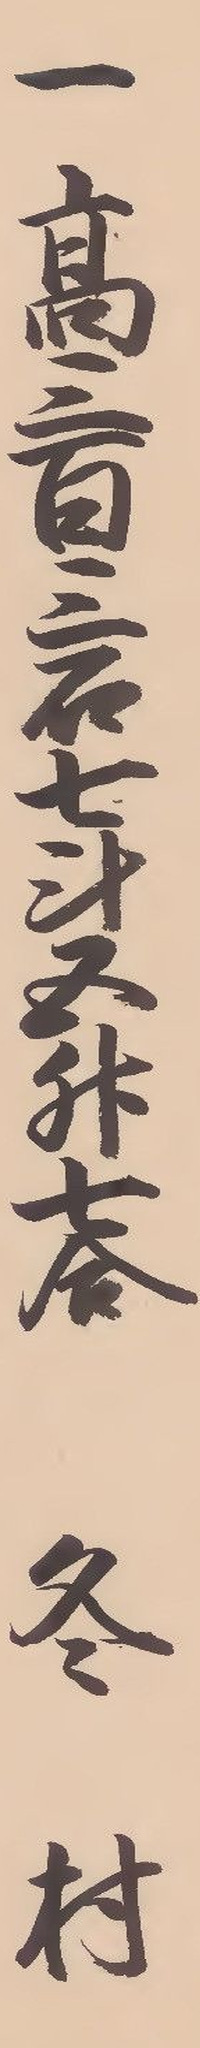一高三百三石七斗五升七合冬村
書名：紀伊国郷帳
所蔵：国立公文書館 National Archives of Japan
